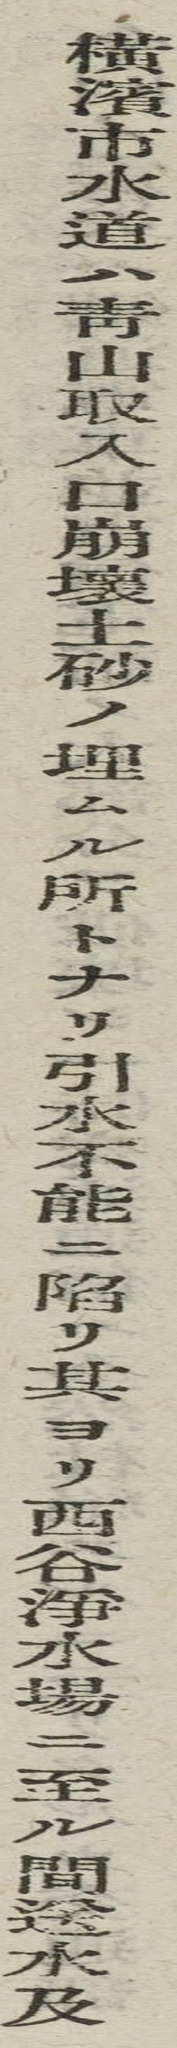横浜市水道ハ青山取水口崩壊土砂ノ埋ムル所トナリ引水不能ニ陥リ其ヨリ西谷浄水場ニ至ル間送水及
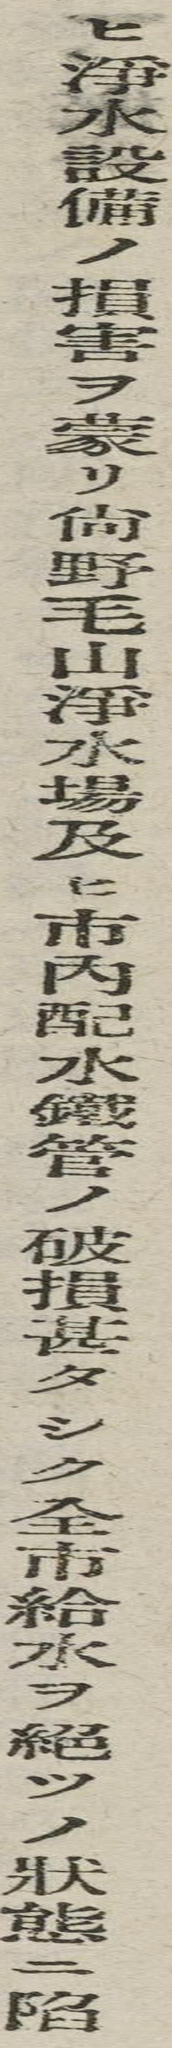ヒ浄水設備ノ損害ヲ蒙リ尚野毛山浄水場及ヒ市内配水鉄管ノ破損甚タシク全市給水ヲ絶ツノ状態ニ陥
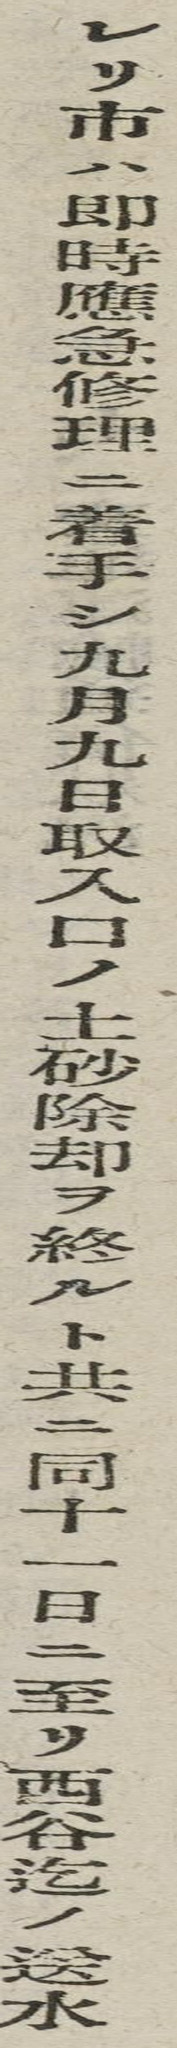レリ市ハ即時応急修理ニ着手シ九月九日取入口ノ土砂除却ヲ終ルト共ニ同十一日ニ至リ西谷迄ノ送水
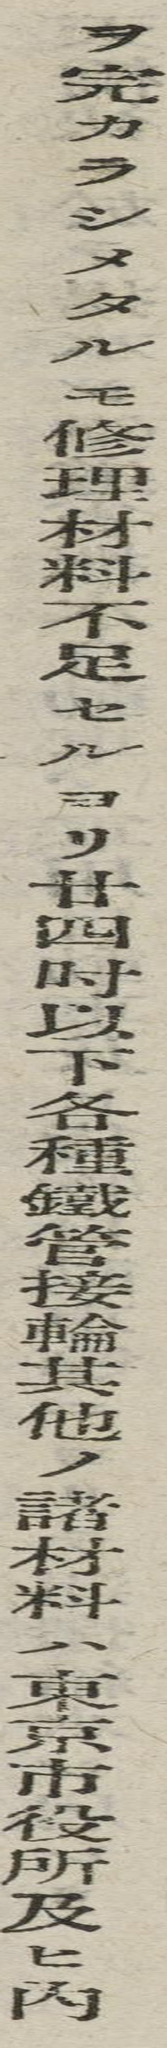ヲ完カラシメタルモ修理材料不足セルヨリ廿四吋以下各種鉄管接輪其他ノ諸材料ハ東京市役所及ヒ内
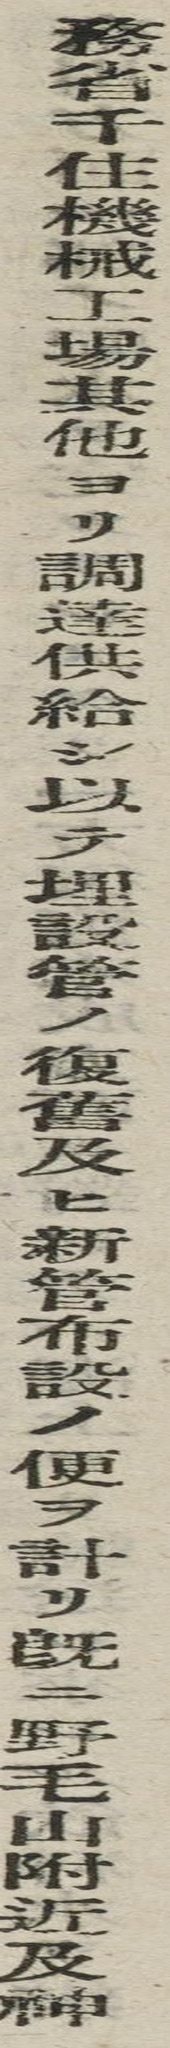務省千住機械工場其他ヨリ調達供給シ以テ埋設管ノ復旧及ヒ新管布設ノ便ヲ計リ既ニ野毛山附近及神

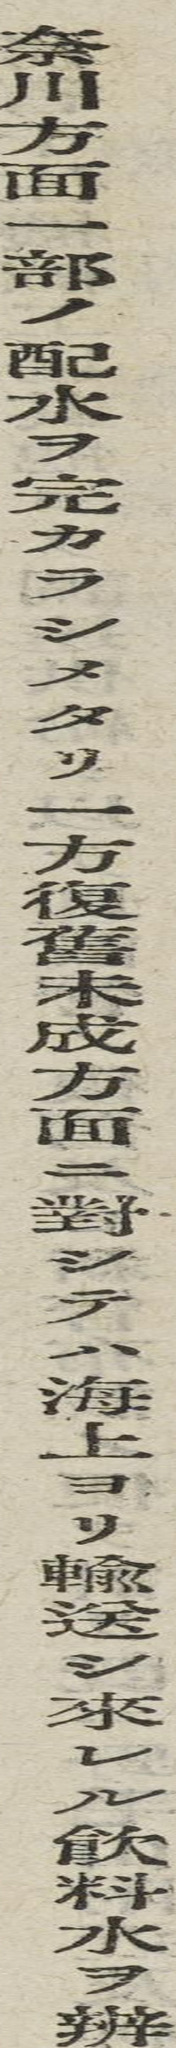奈川方面一部ノ配水ヲ完カラシメタリ一方復旧未成方面ニ対シテハ海上ヨリ輸送シ来レル飲料水ヲ弁
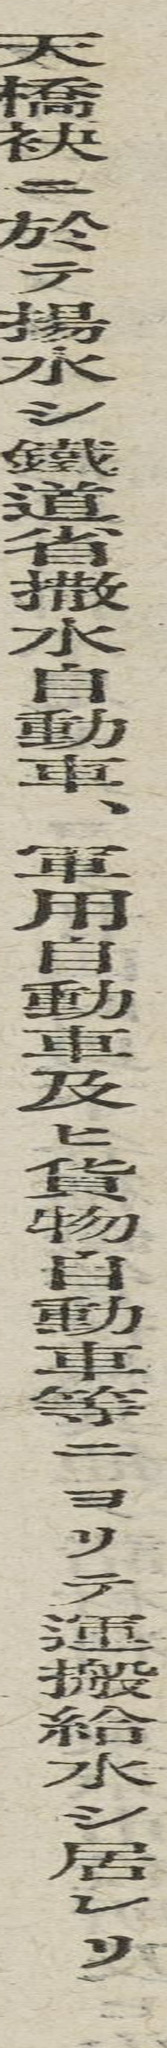天橋袂ニ於テ揚水シ鉄道省散水自動車、軍用自動車及ヒ貨物自動車等ニヨリテ運搬給水シ居レリ
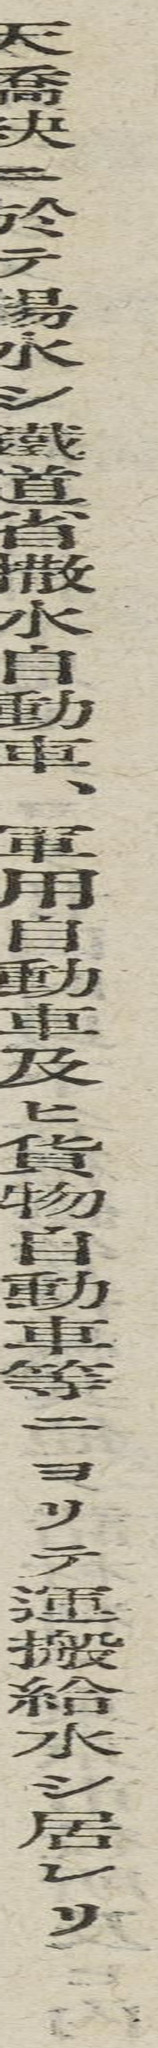天橋袂ニ於テ揚水シ鉄道省散水自動車、軍用自動車及ヒ貨物自動車等ニヨリテ運搬給水シ居レリ
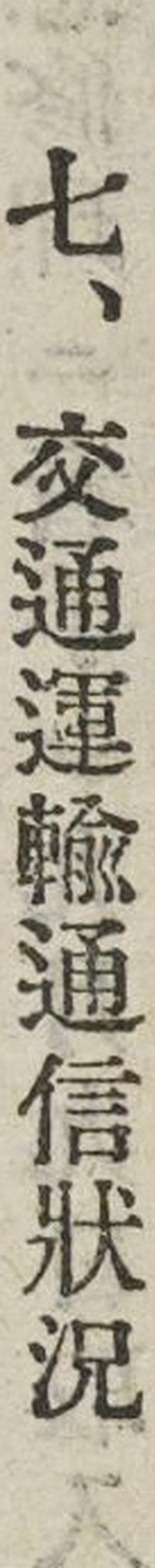七、交通運輸通信状況
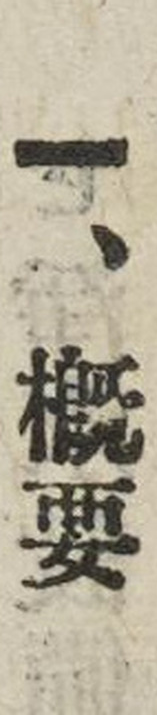一、概要
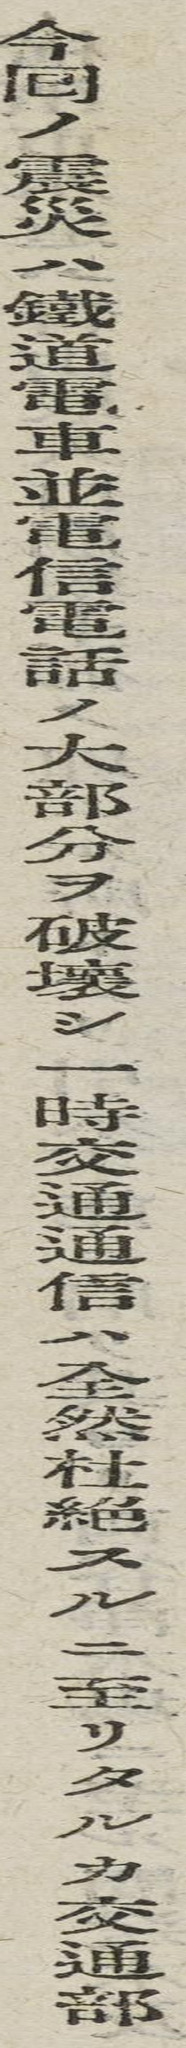今回ノ震災ハ鉄道電車並電信電話ノ大部分ヲ破壊シ一時交通通信ハ全然杜絶スルニ至リタルカ交通部
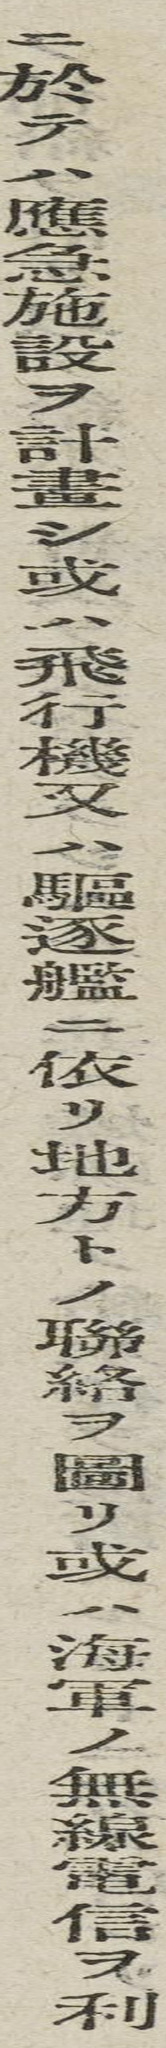ニ於テハ応急設備ヲ計画シ或ハ飛行機又ハ駆逐艦ニ依リ地方トノ連絡ヲ図リ或ハ海軍ノ無線通信ヲ利
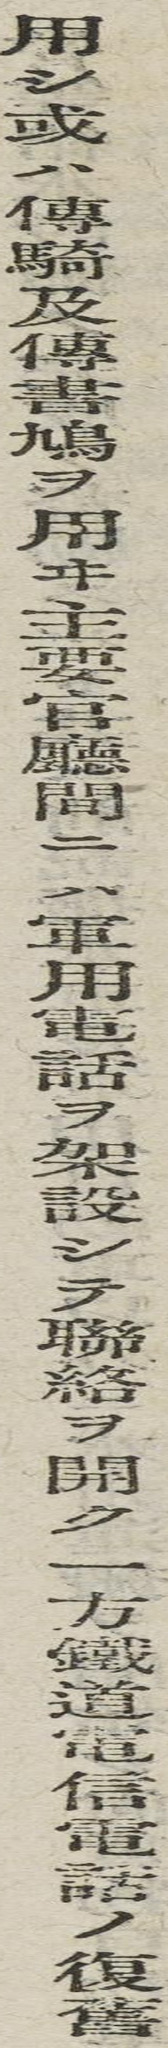用シ或ハ伝騎及伝書鳩ヲ用ヰ主要官庁間ニハ軍用電話ヲ架設シテ連絡ヲ開ク一方鉄道電信電話ノ復旧
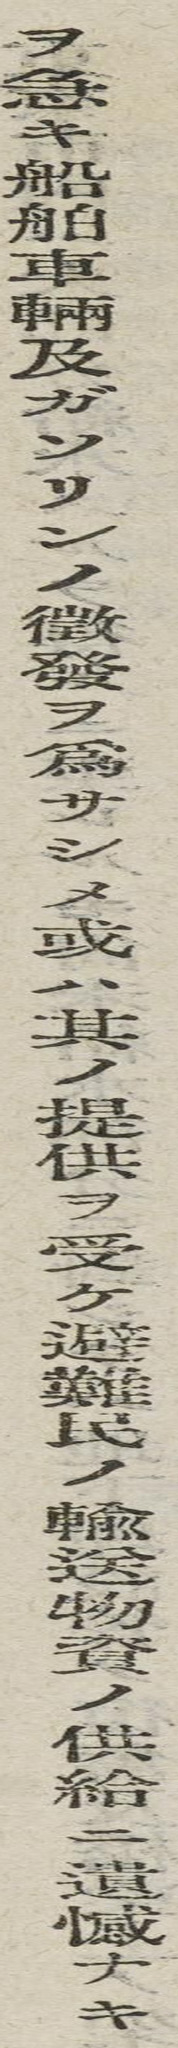ヲ急キ船舶車輌及ガソリンノ徴発ヲ為サシメ或ハ其ノ提供ヲ受ケ避難民ノ輸送物資ノ供給ニ遺憾ナキ
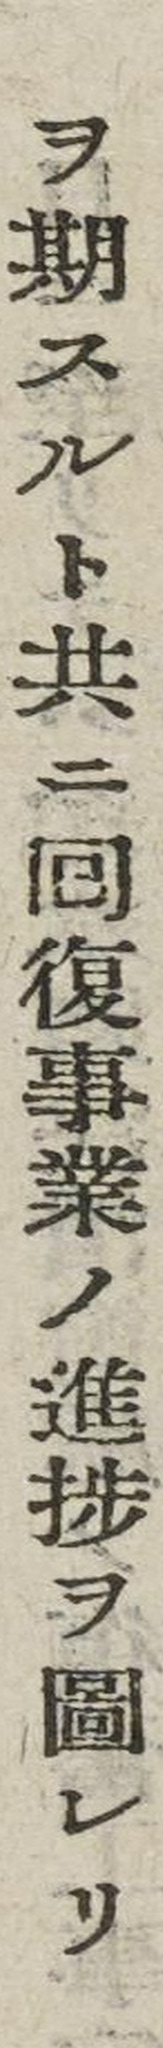ヲ期スルト共ニ回復事業ノ進捗ヲ図レリ
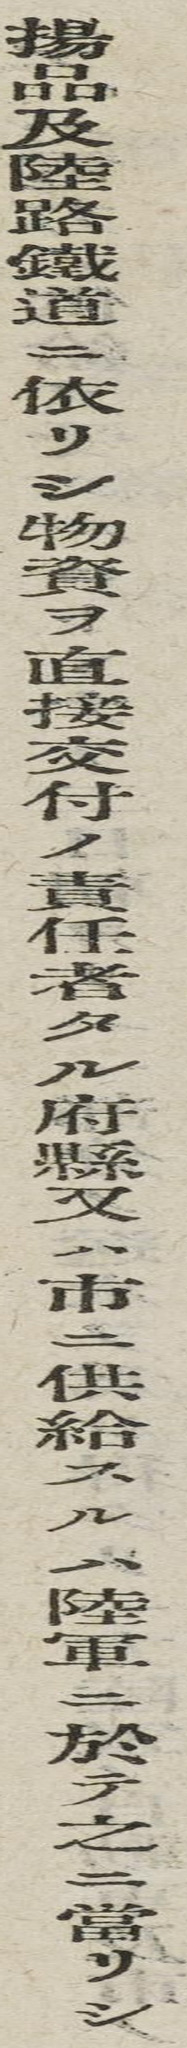揚品及陸路鉄道ニ依リシ物資ヲ直接交付ノ責任者タル府県又ハ市ニ供給スルハ陸軍ニ於テ之ニ当リシ
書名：震災被害状況並救護施設概要
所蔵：東京大学地震研究所図書室 Earthquake Research Institute Library, The University of Tokyo, JAPAN
